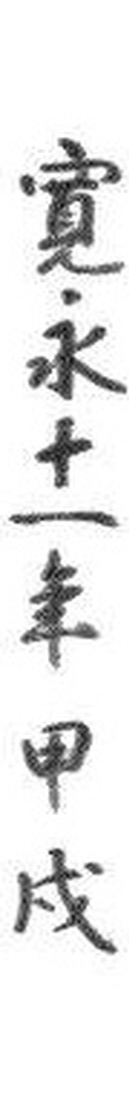寛永十一年甲戌
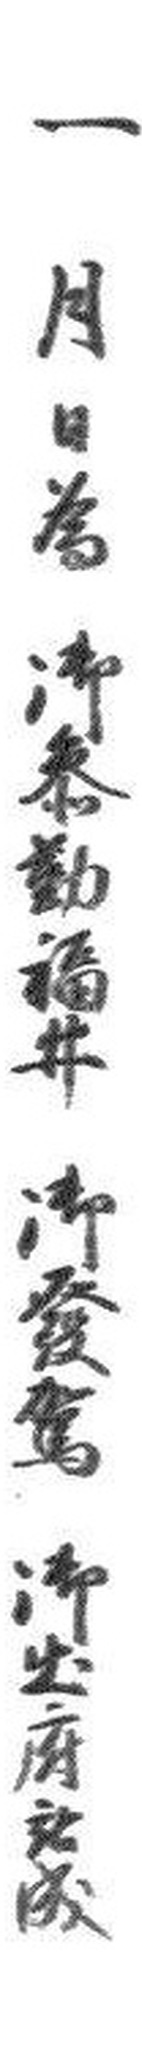一月日為御参勤福井御発駕御出府被成
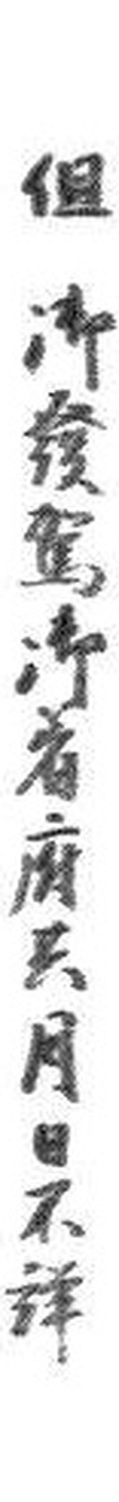但御発駕御着府共月日不詳
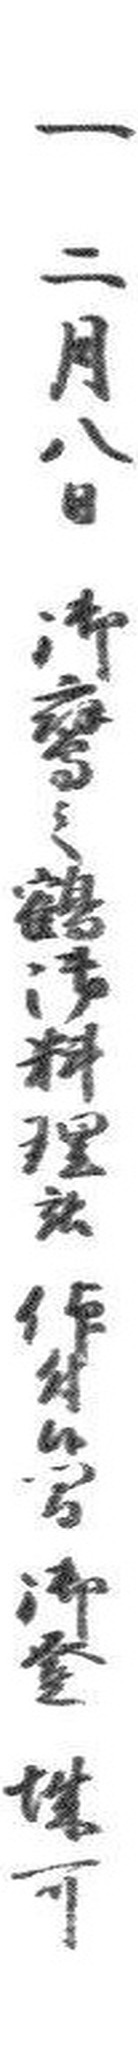一二月八日御鷹之鶴御料理被仰付候間御登城可
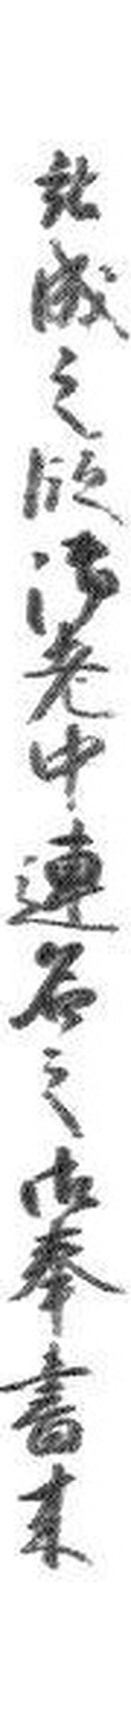被成之段御老中連名之御奉書来
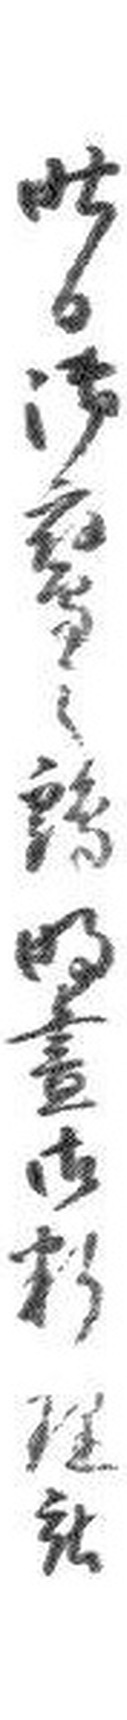昨日御鷹之鶴明昼御料理被
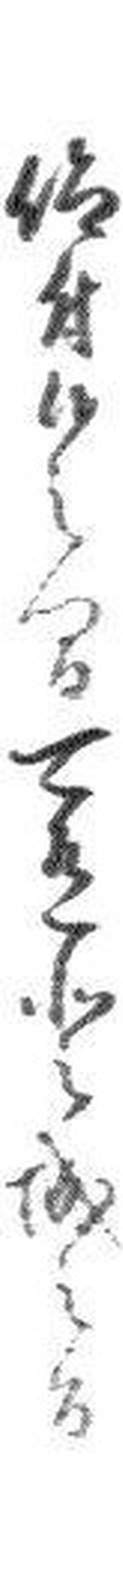仰付候之間可有登城之旨
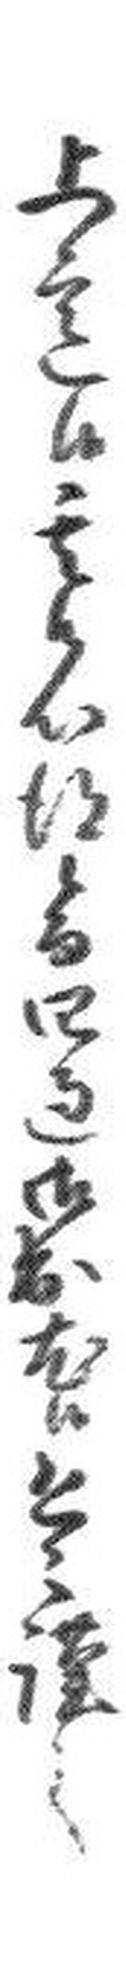上意候其御心得ニ而四過御出尤候恐々謹言

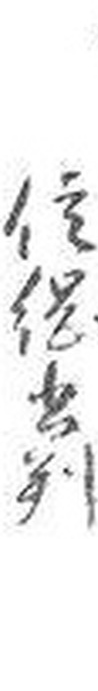信綱書判
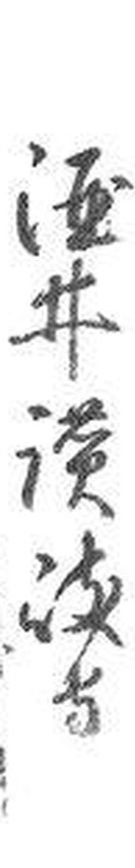酒井讃岐守
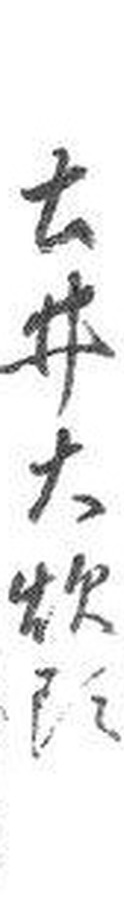土井大炊頭
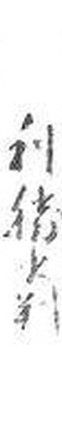利勝書判
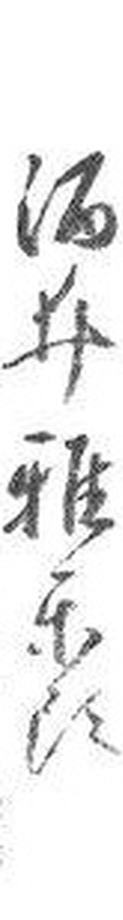酒井雅楽頭
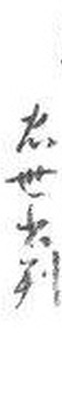忠世書判
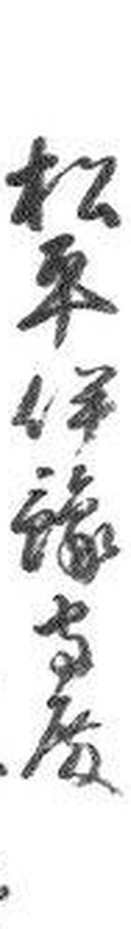松平伊予守殿
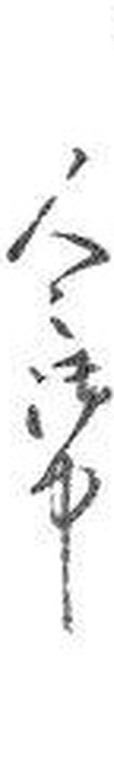人々御中
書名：家譜 四 忠昌公 従寛永七年到正保四年
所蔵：福井県文書館 Fukui Prefectural Archives
